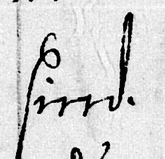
ind¬
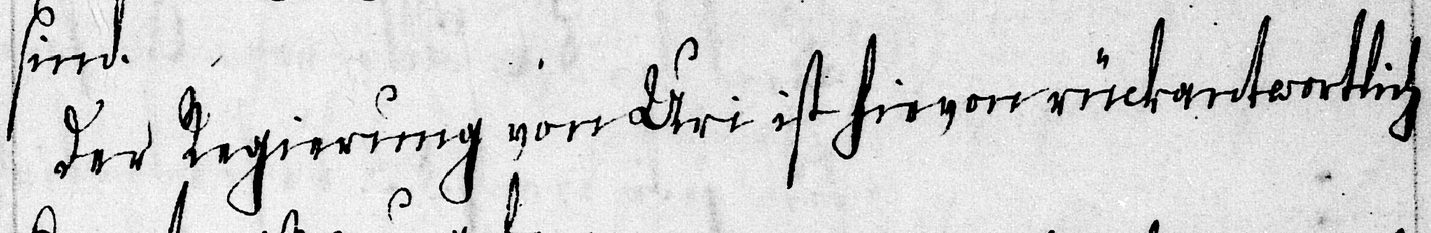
Der Regierung von Uri ist hievon rückantwortlich
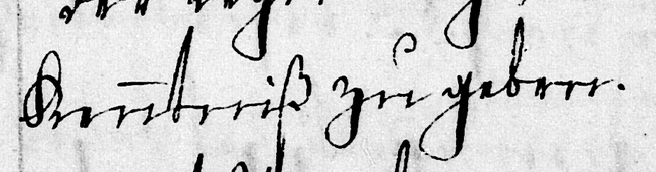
Kenntniß zu geben.
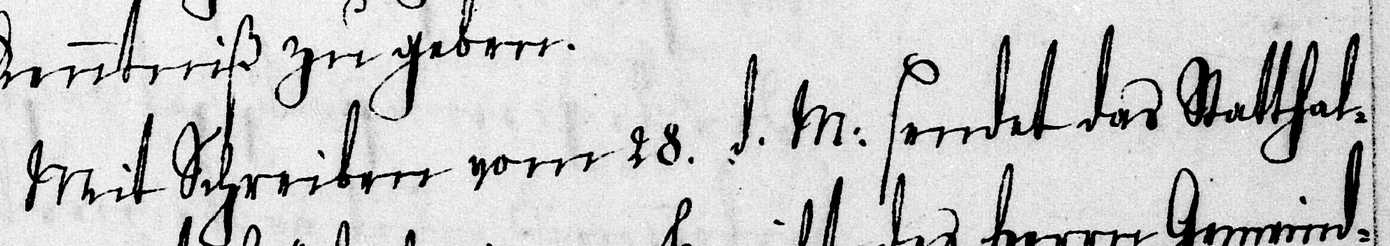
Mit Schreiben vom 28. d. M. sendet das Stattha¬
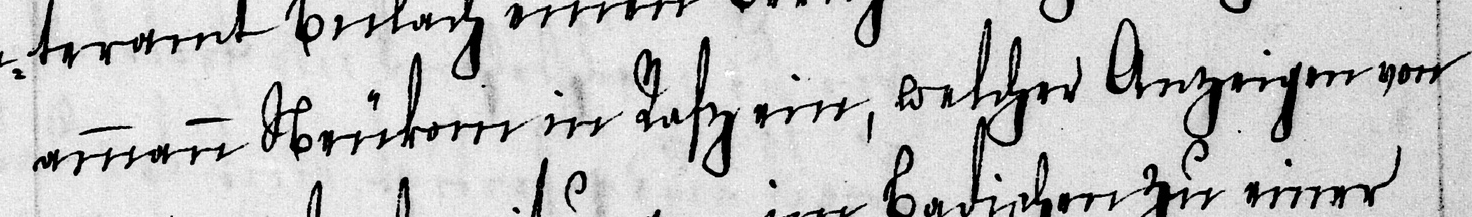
ammann Neukom in Rafz ein, welcher Anzeigen von
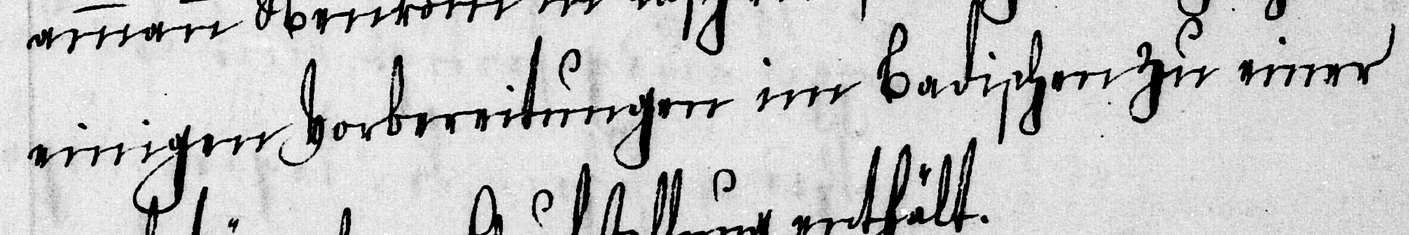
einigen Vorbereitungen im Badischen zu einer
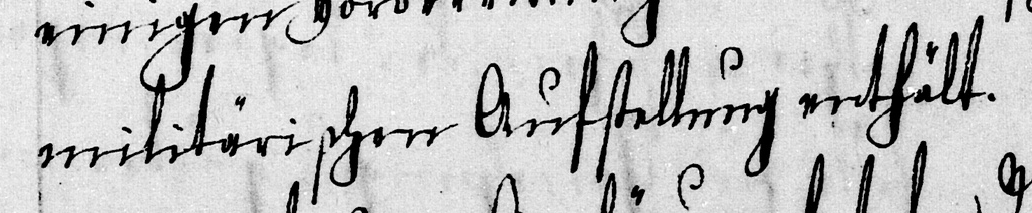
militärischen Aufstellung genthält.
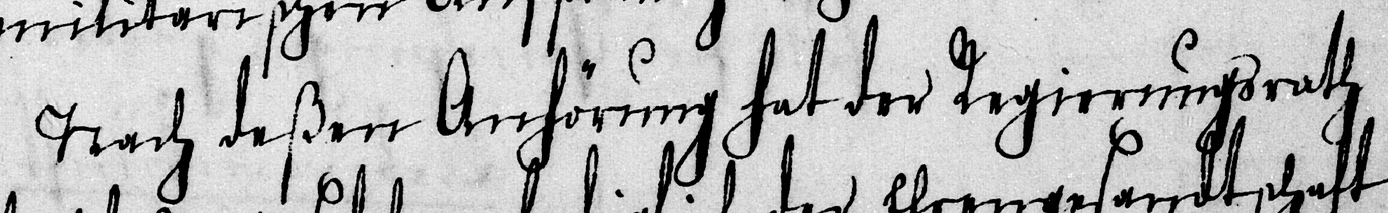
Nach deßen Anhörung hat der Regierungsrath
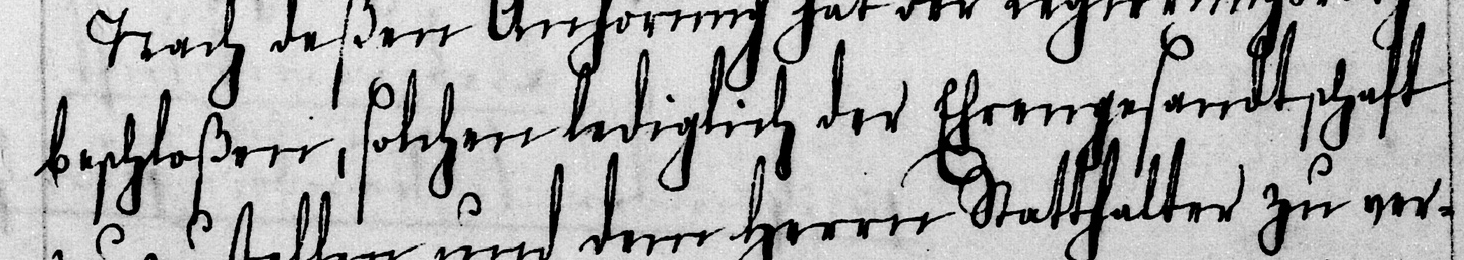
beschloßen, solchen lediglich der Ehrengesandtschaft
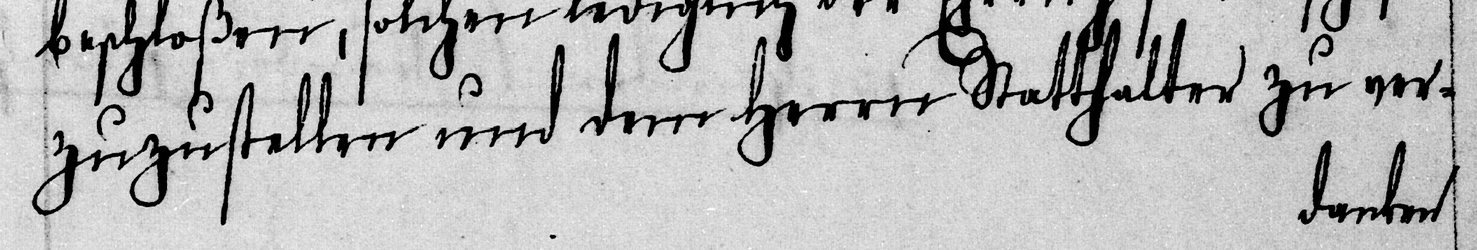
zuzustellen und dem Herrn Statthalter zu ver-
